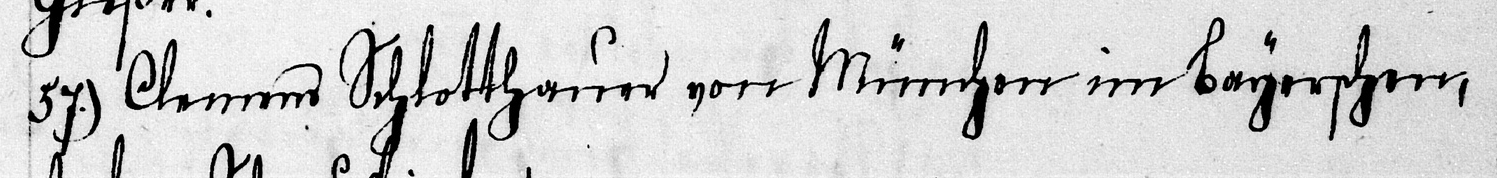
57.) Clemens Schlotthauer von München im Bayerschen,
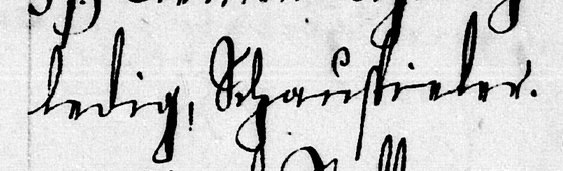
ledig, Schauspieler.
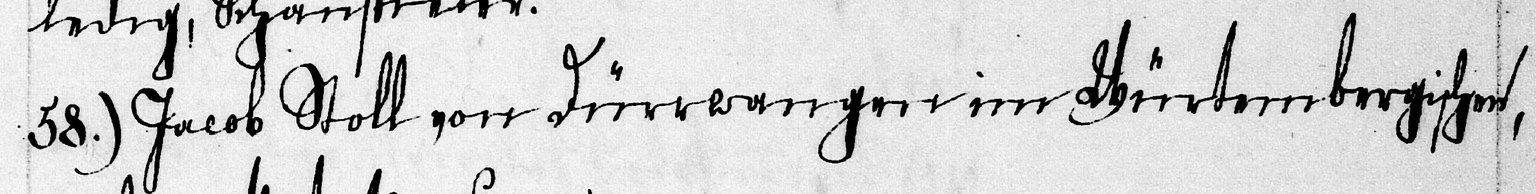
58.) Jacob Stoll von Dürrwangen im Würtembergischen,
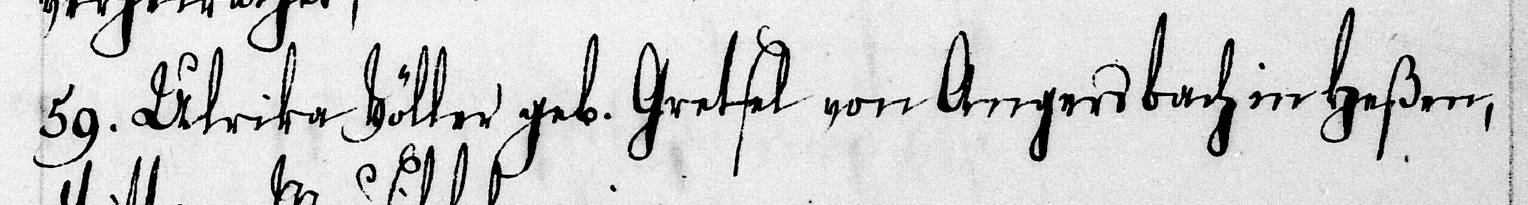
59.) Ulrika Völler geb. Gretsel von Angersbach in Heßen,
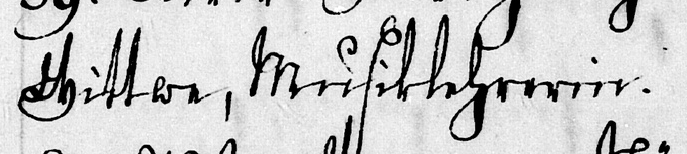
Wittwe, Musiklehrerin.
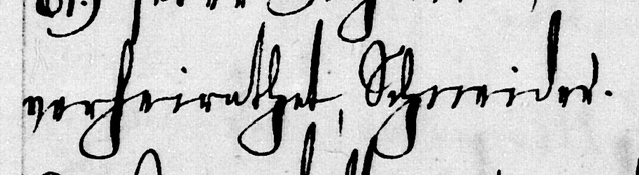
verheirathet, Schneider.
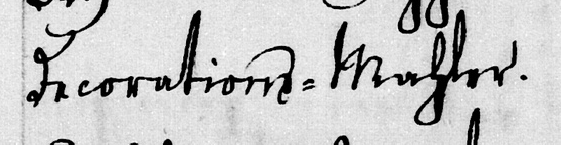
Decorations-Mahler.
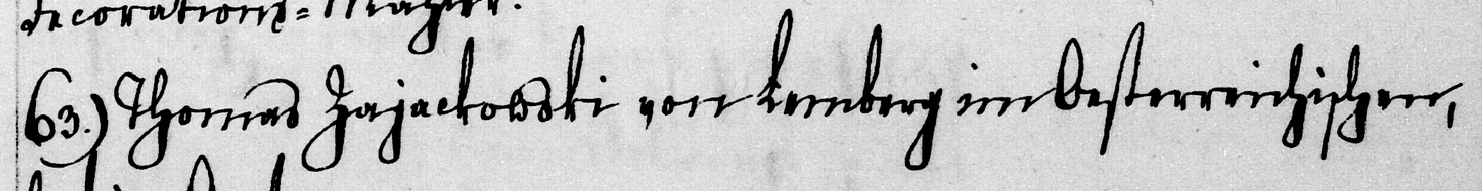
63.) Thomas Zajackowski von Lemberg im Oesterreichischen,
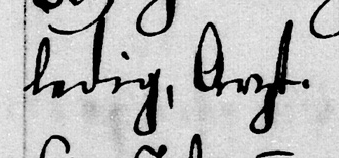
ledig, Arzt.
